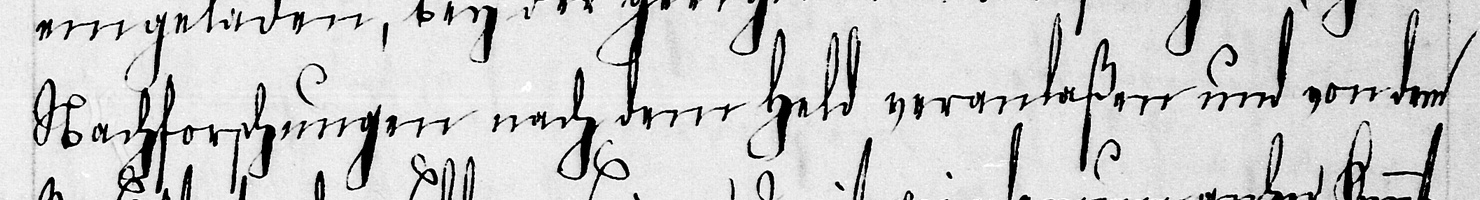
Nachforschungen nach dem Held veranlaßen und von dem
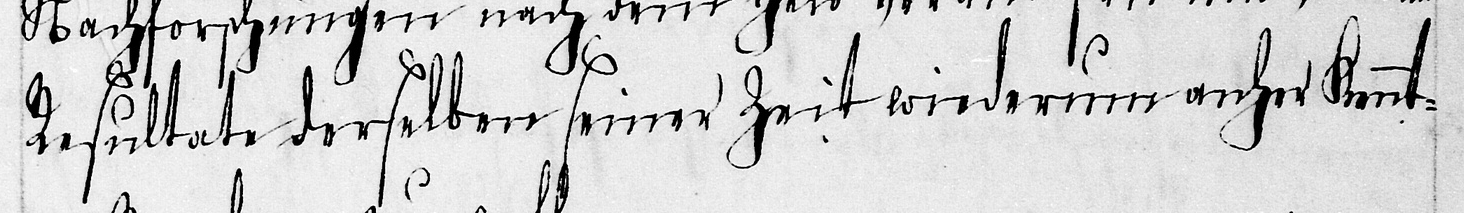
Resultate derselben seiner Zeit wiederum anher Kennt¬
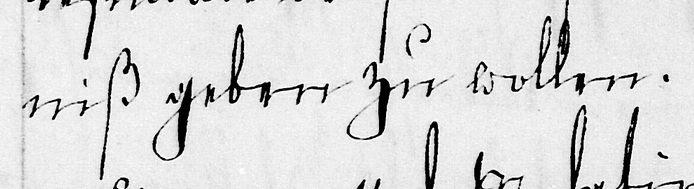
niß geben zu wollen.
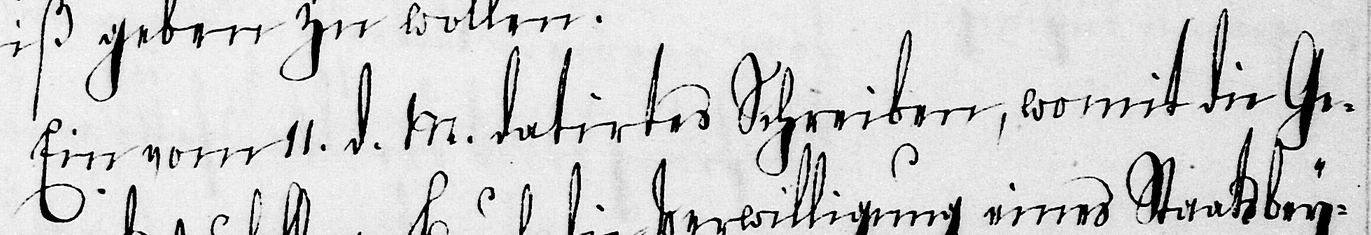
Ein vom 11. d. M. datirtes Schreiben, womit die Ge¬
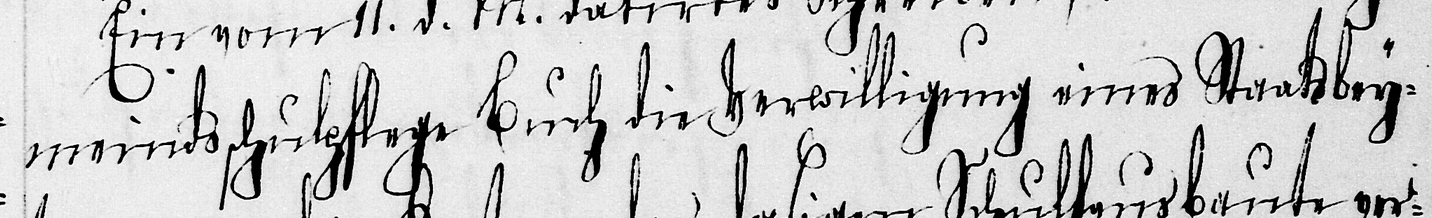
meindsschulpflege Buch die Verwilligung eines Staatsbey¬
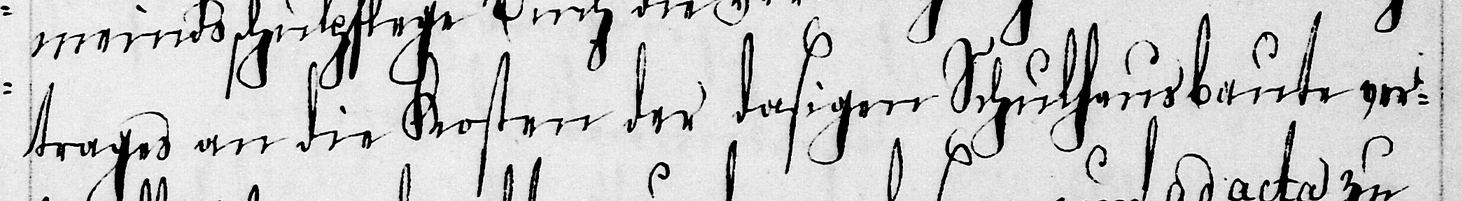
trages an die Kosten der dasigen Schulhausbaute ver¬
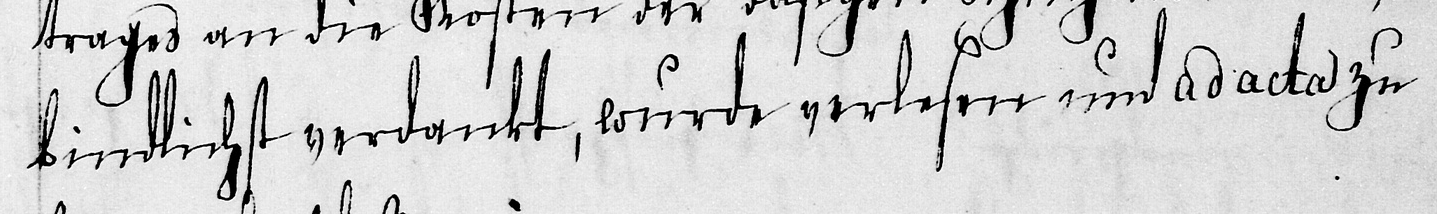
bindlichst verdankt, wurde verlesen und ad acta zu
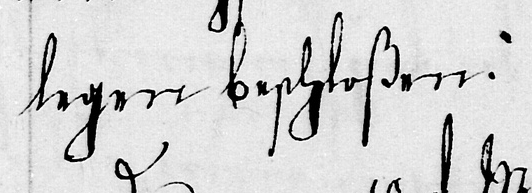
legen beschloßen.
